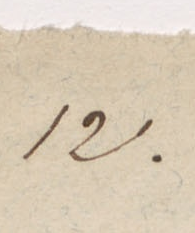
12.
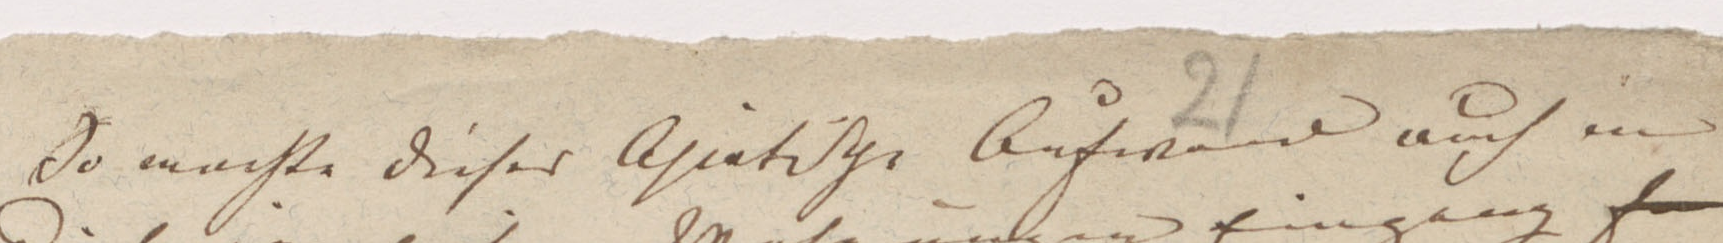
So mochte dieser Asiatische Aufwand auch in
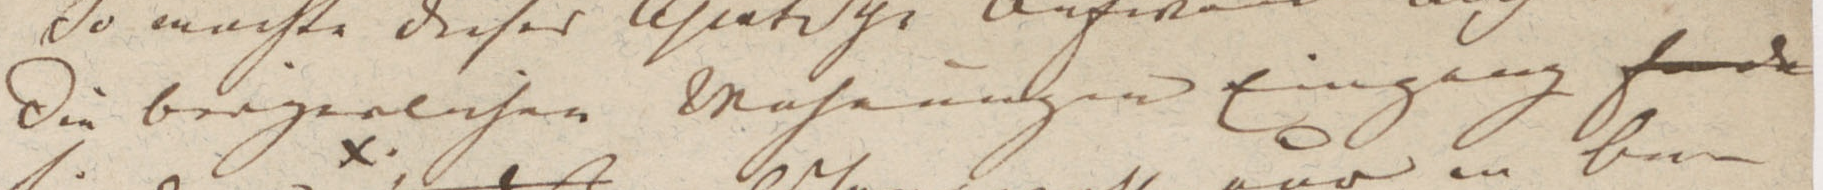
die bürgerlichen Wohnungen Eingang finde
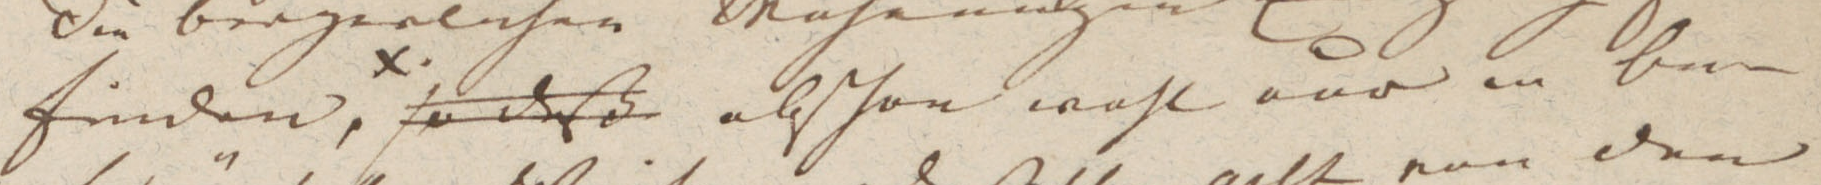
finden,% so dass obschon wohl nur in be-
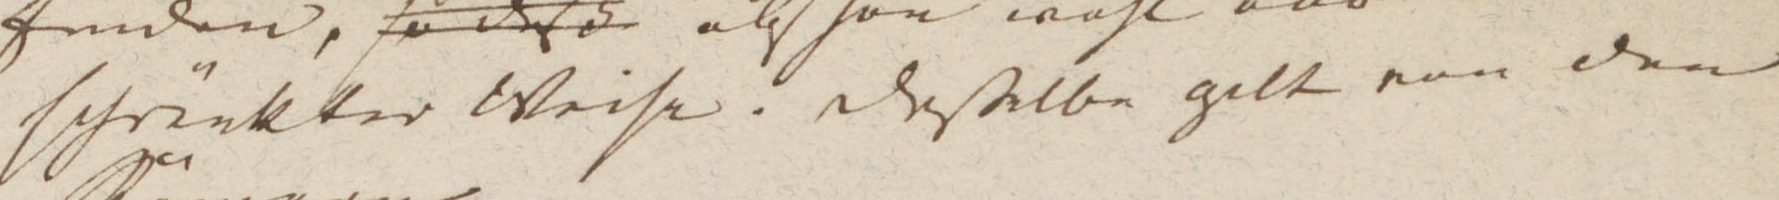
schränkter Weise. Dasselbe gilt von den
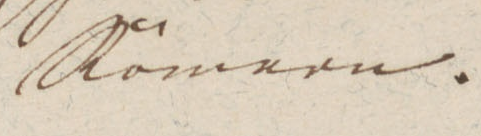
Römern.
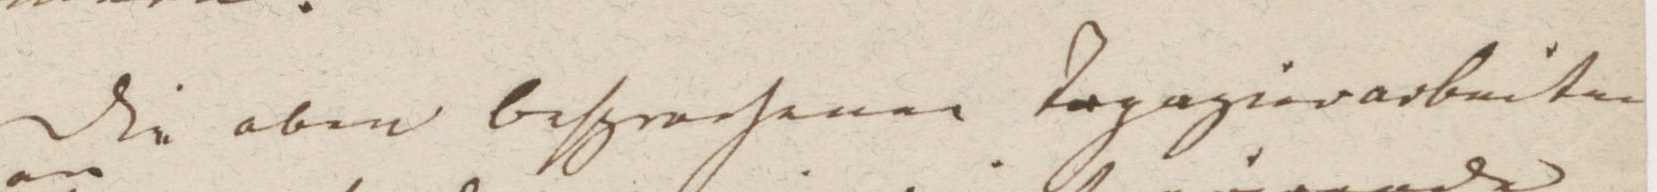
Die oben besprochenen Tapezierarbeiten
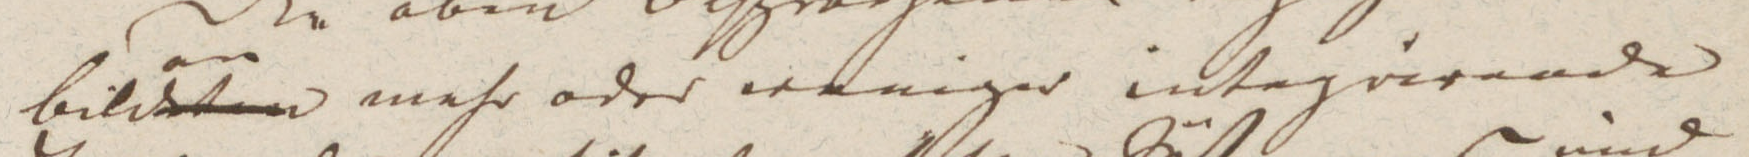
bildetenen mehr oder weniger integrirende
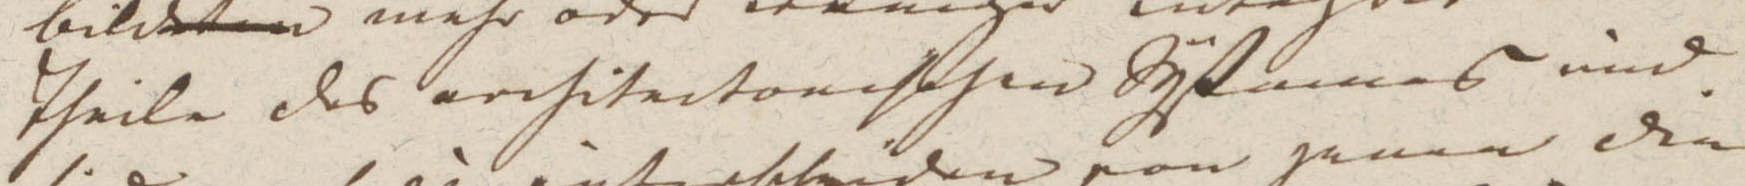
Theile des architectonischen Systemes und
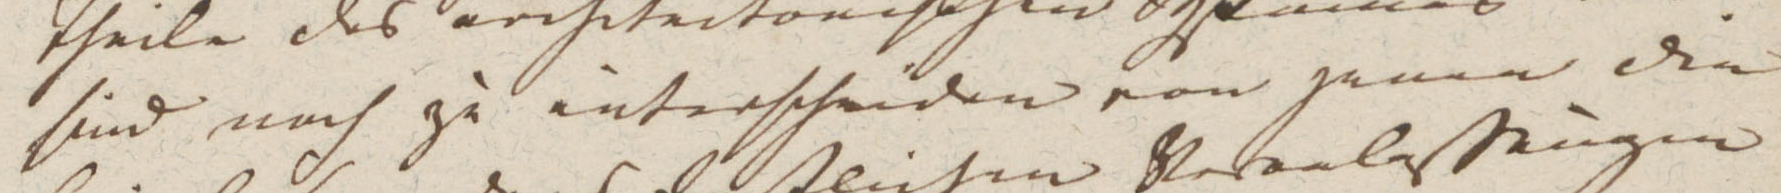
sind noch zu unterscheiden von jenen die
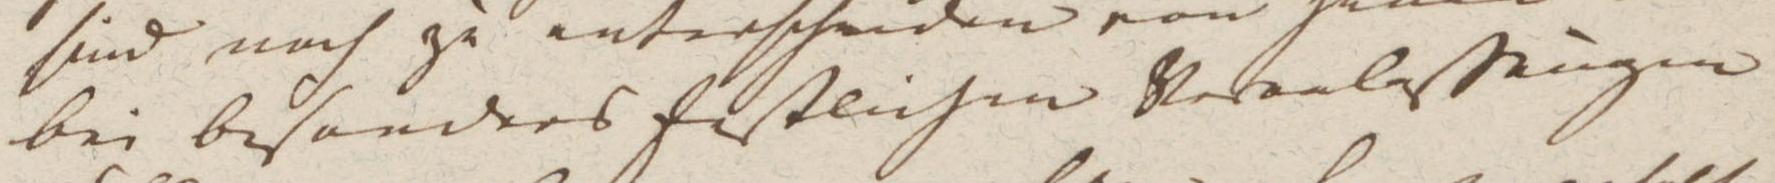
bei besonders festlichen Veranlassungen
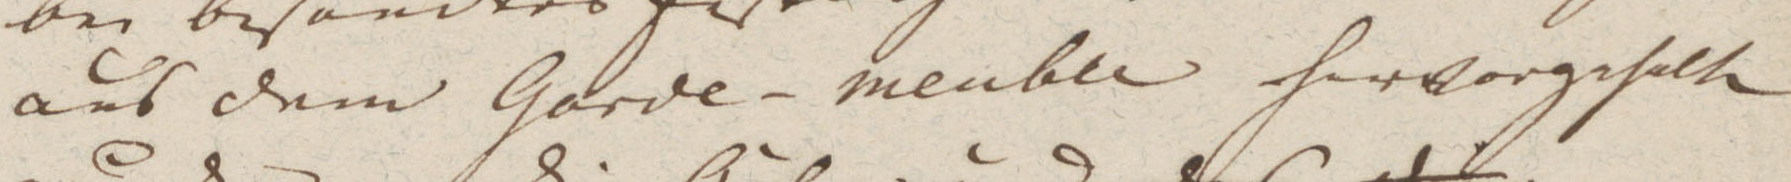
aus dem Garde-meuble hervorgeholt
